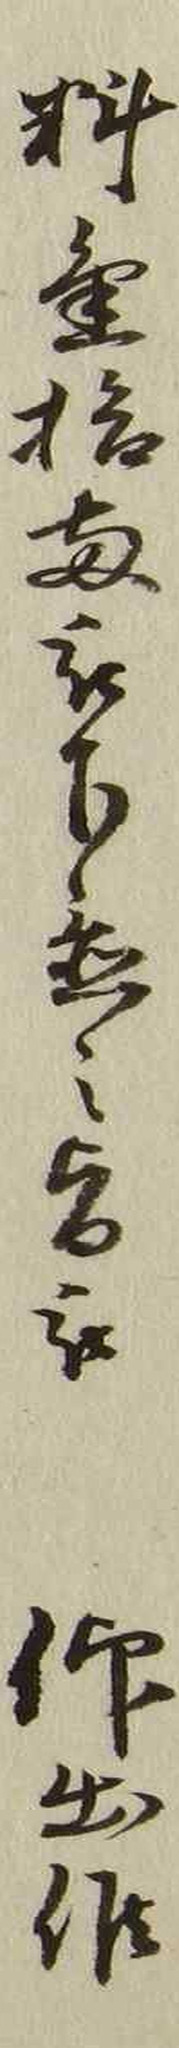料金拾両被下置之旨被仰出候
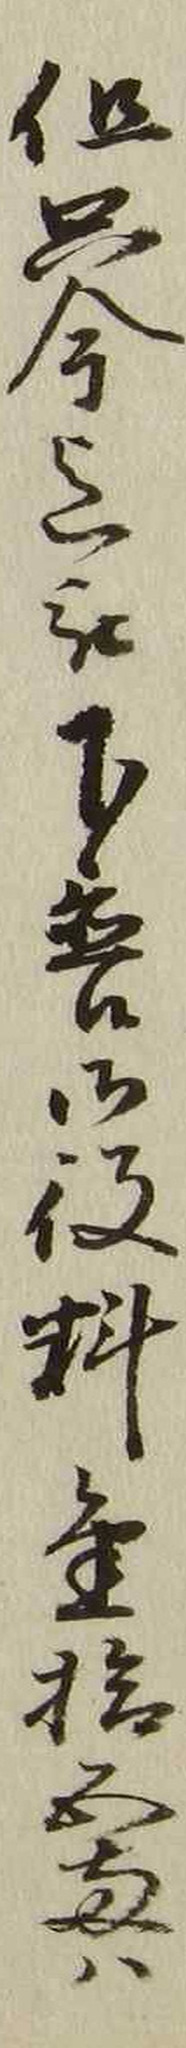但只今迄被下置候御役料金拾五両ハ
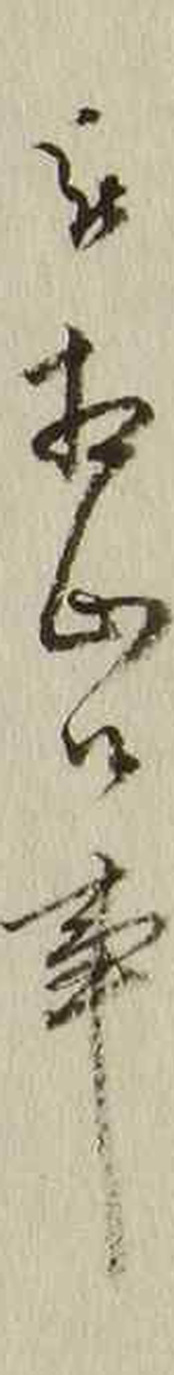被相止候事
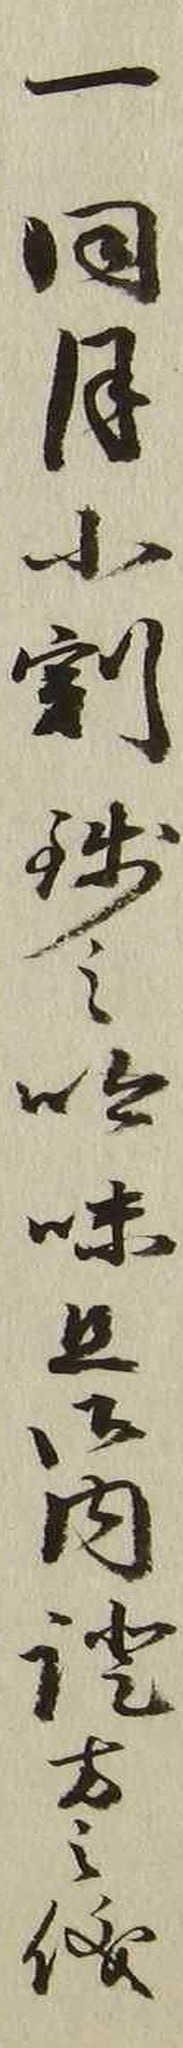一同月小割銭之吟味且御内証方之儀
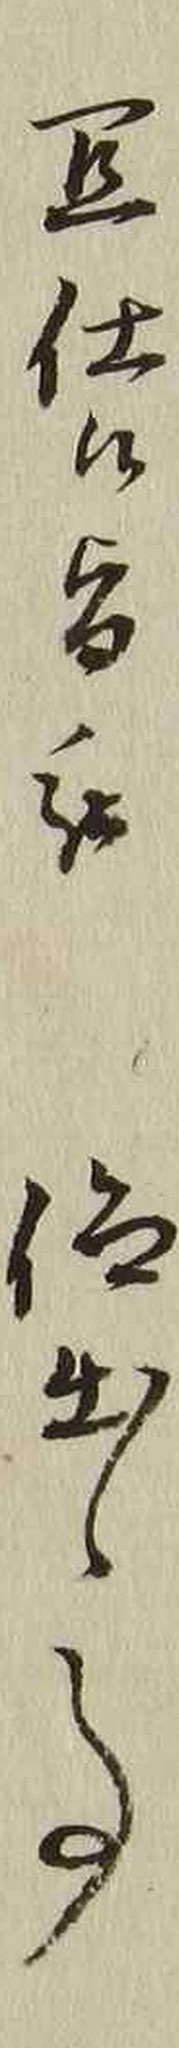宜仕候旨被仰出候事
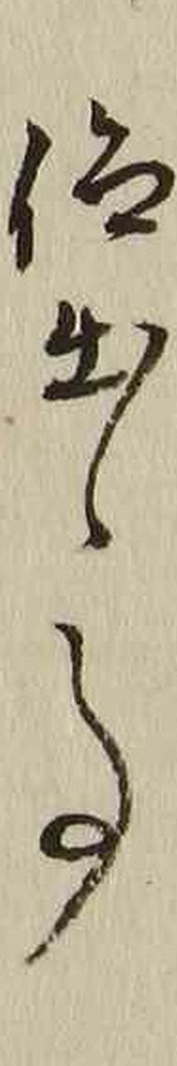仰出候事
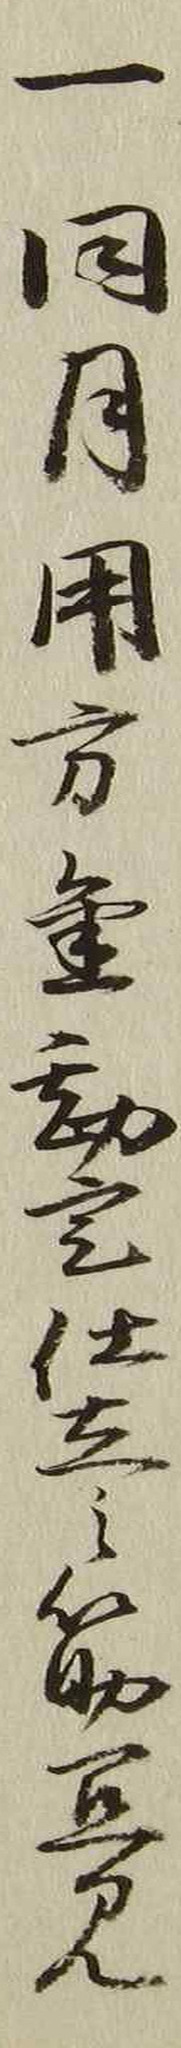一同月用方金勘定仕立之筋宜見
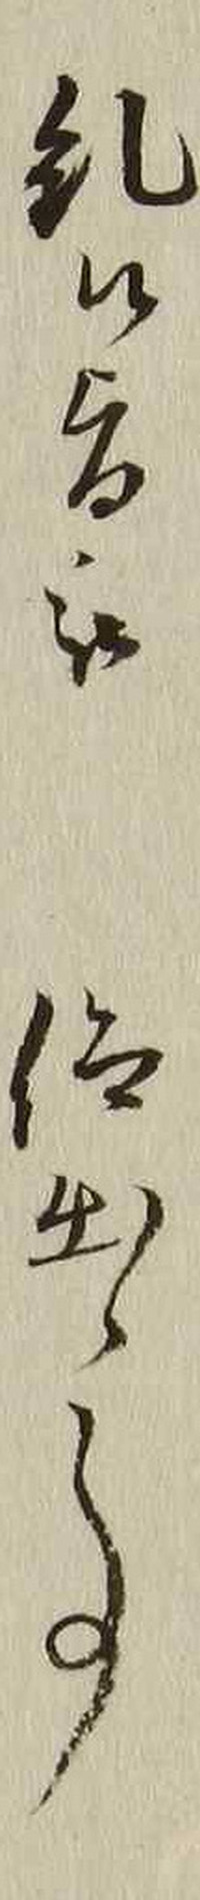糺候旨被仰出候事
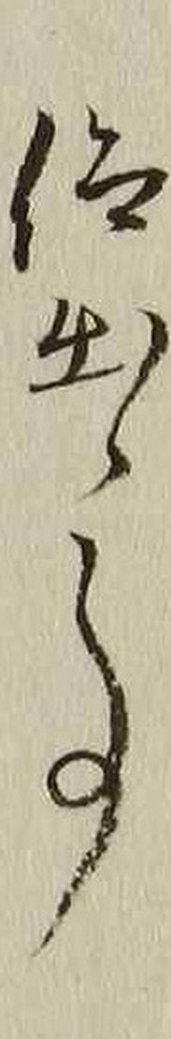仰出候事
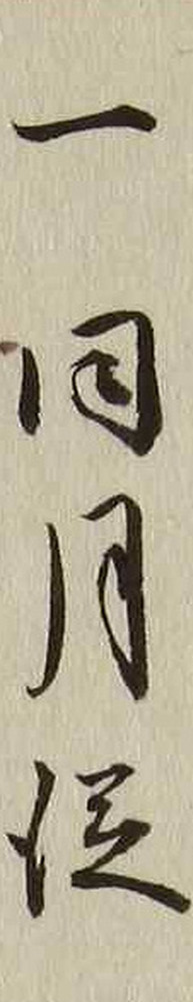一同月従
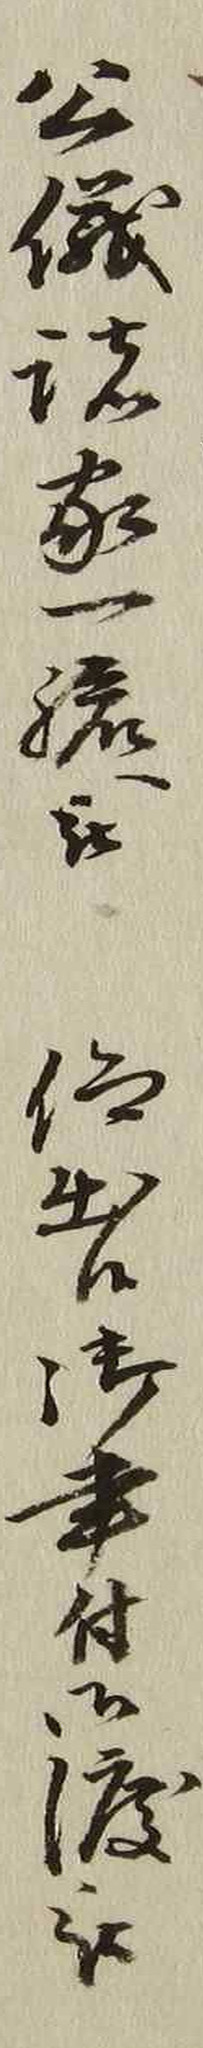公儀諸家一統へ被仰出候御書付御渡被
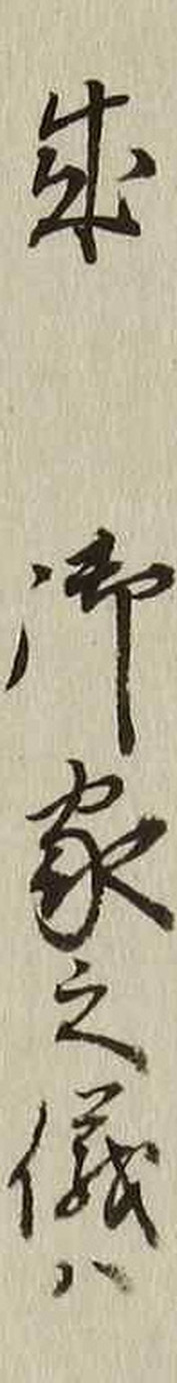成御家之儀ハ
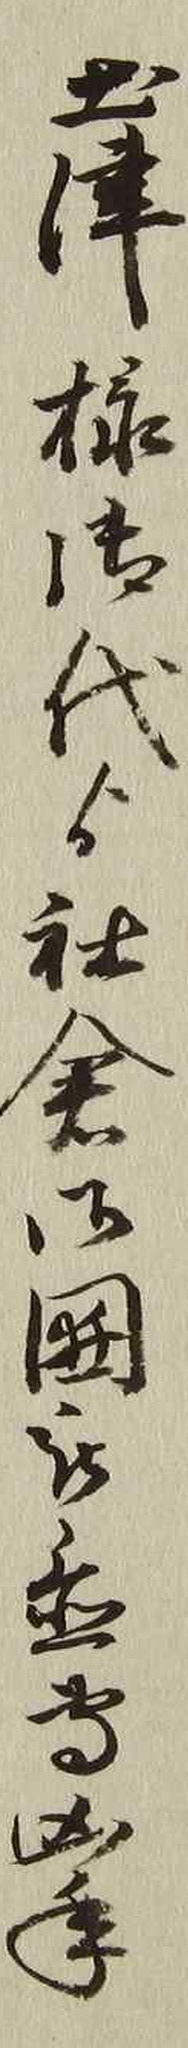土津様御代ゟ社倉御囲被置専凶年
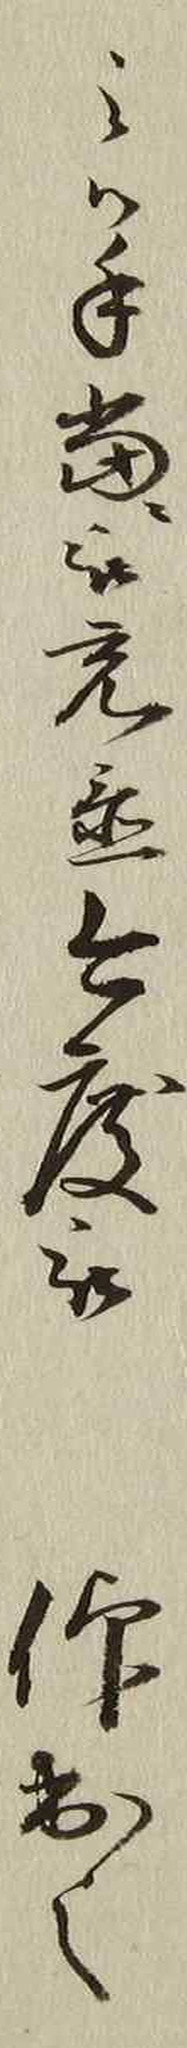之御手当ニ被充置今度被仰出之
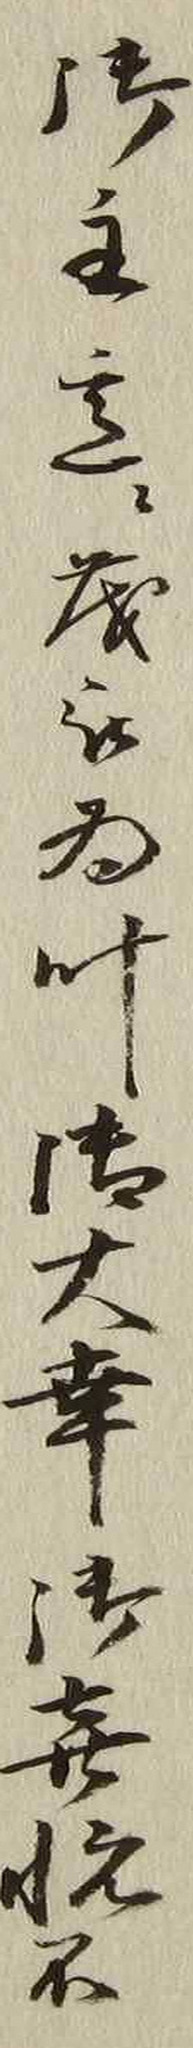御主意ニも被為叶御大幸御喜悦不
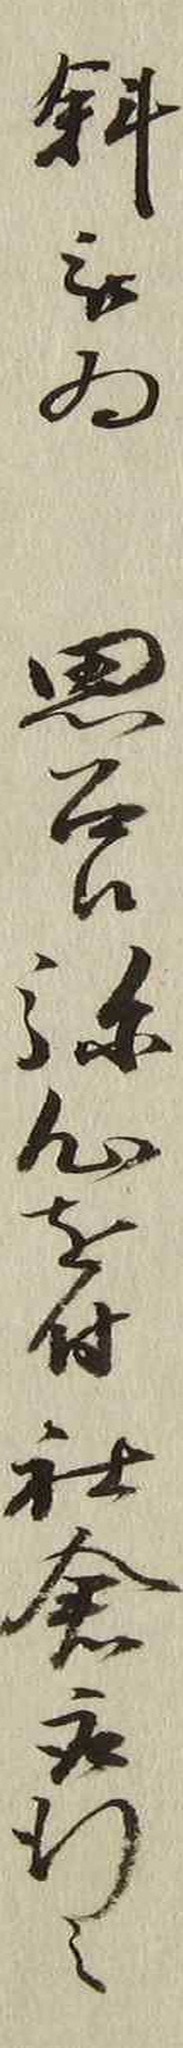斜被為思召候弥心を付社倉取行之
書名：諸士系譜　巻之61　と之部4
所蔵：会津若松市立会津図書館
